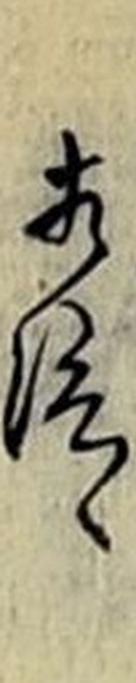相渡候
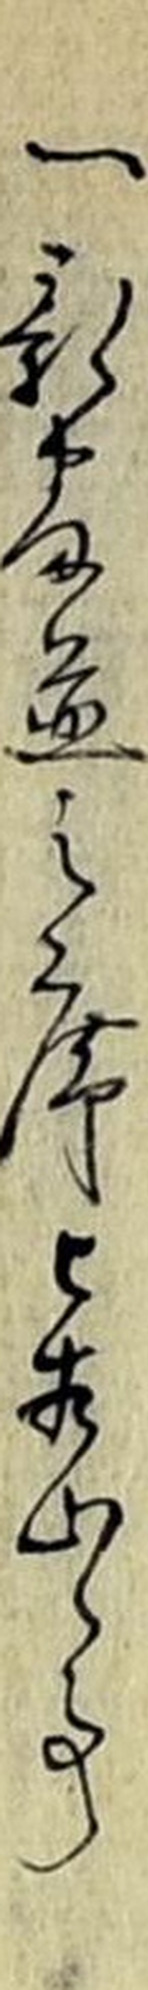一新番並之席被相止候事
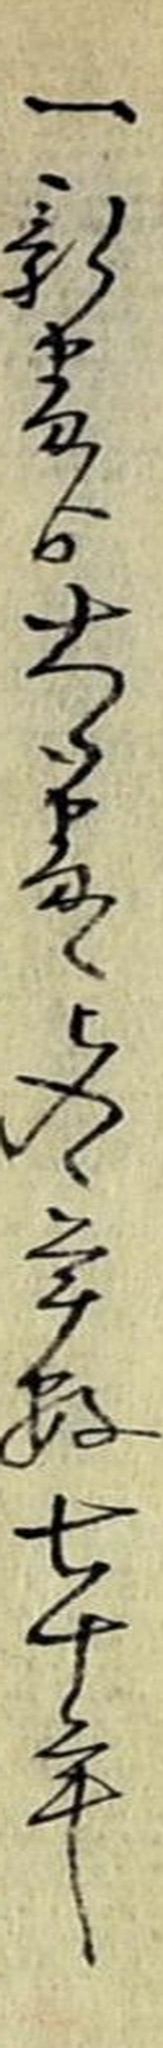一新番ゟ大御番へ被入候年数七十年
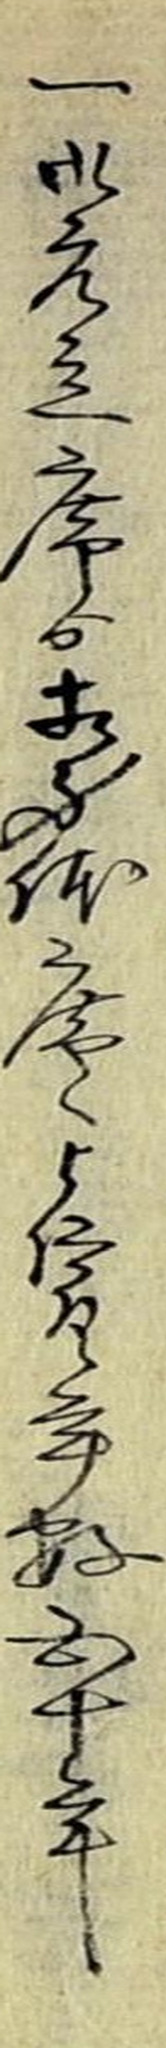一御取立席ゟ相身体席へ被仰付候年数五十年
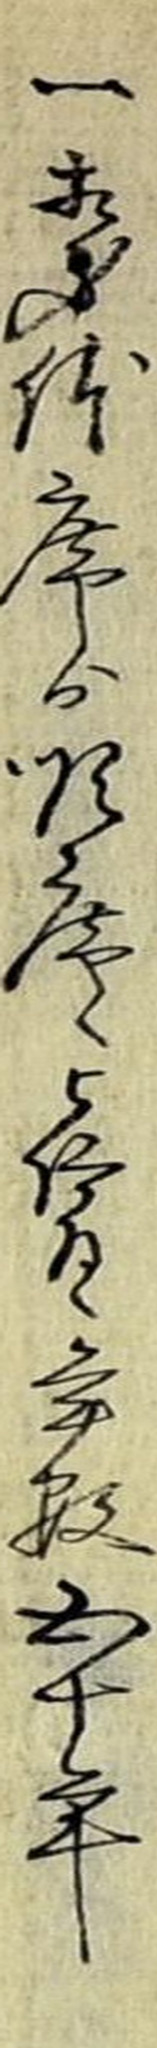一相身体席ゟ順席へ被仰付候年数五十年
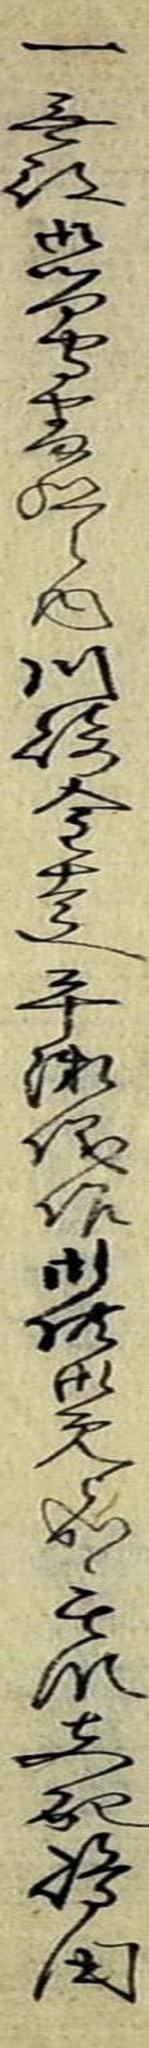一無役御留守番組之内川崎金太夫平瀬儀作御供御免被成候其段支配島田
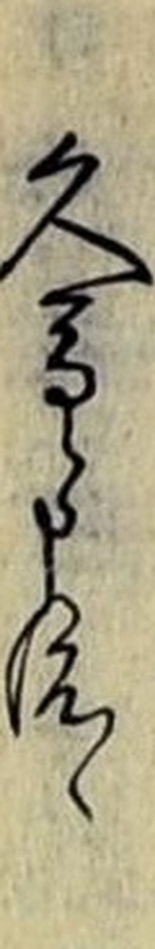久馬申渡候
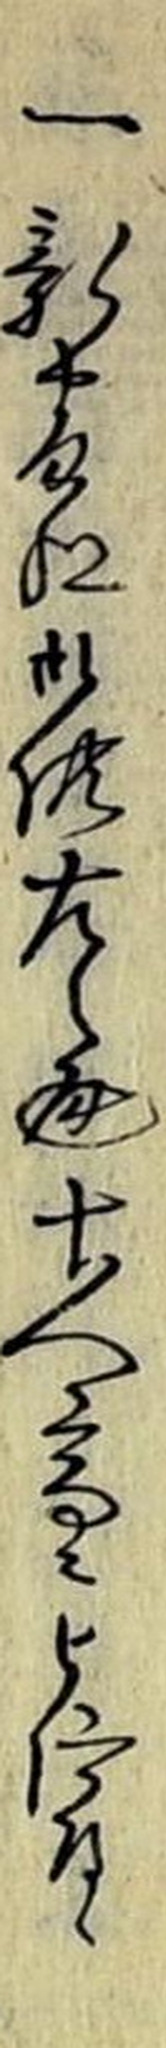一新番組御供左之通十人高に被仰付候
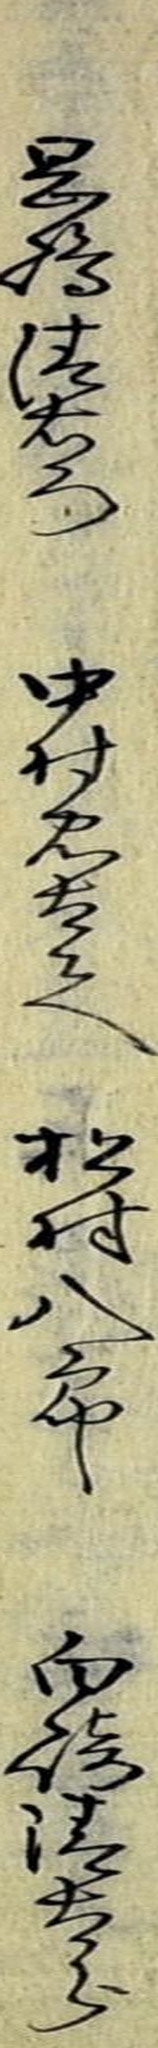岡嶋清右衛門中村忠太夫松村八郎白崎清太郎
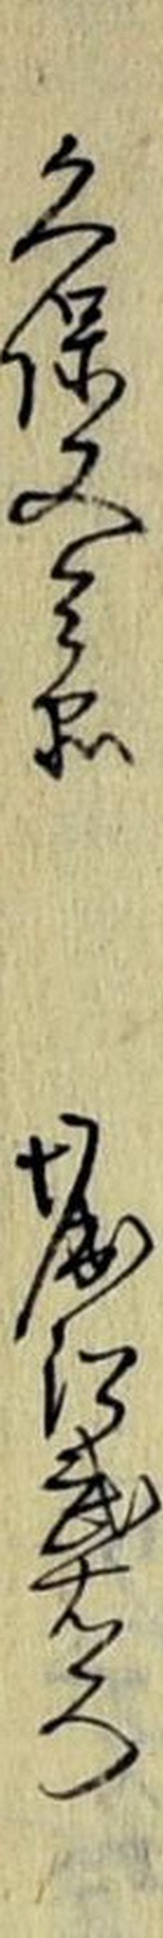久保又兵衛堀江武右衛門
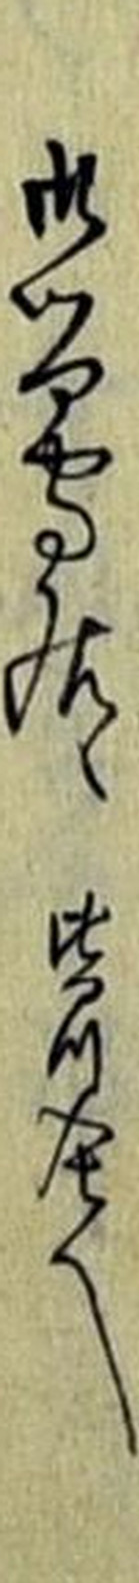御留守居へ皆川舎人
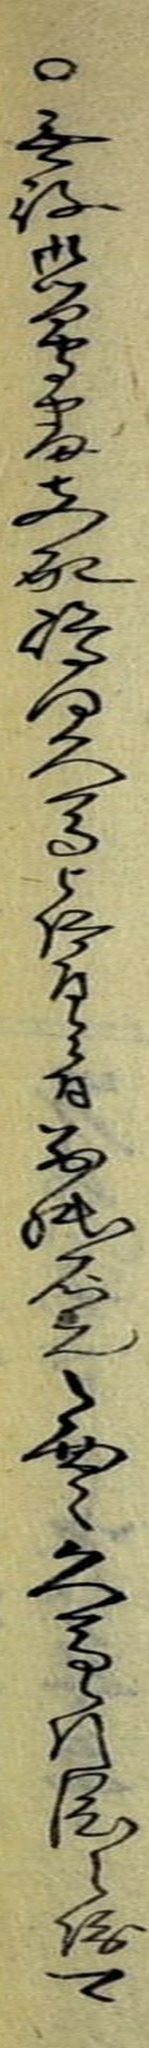○無役御留守番支配嶋田久馬被仰付候に付別紙名元之面々久馬へ引渡之儀可
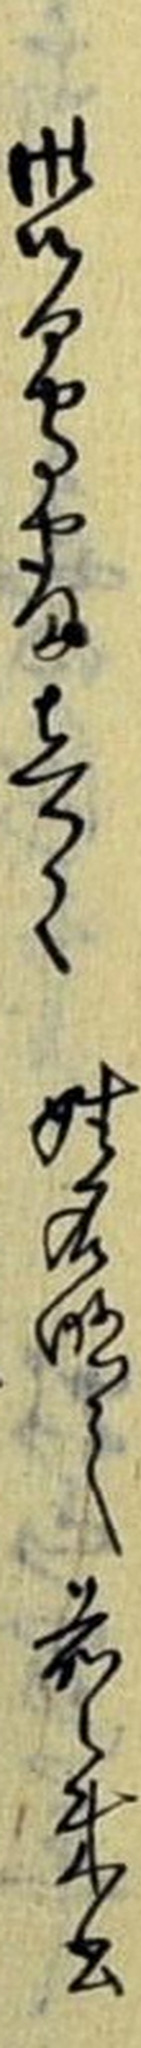御留守番云々姓名略之前之来書
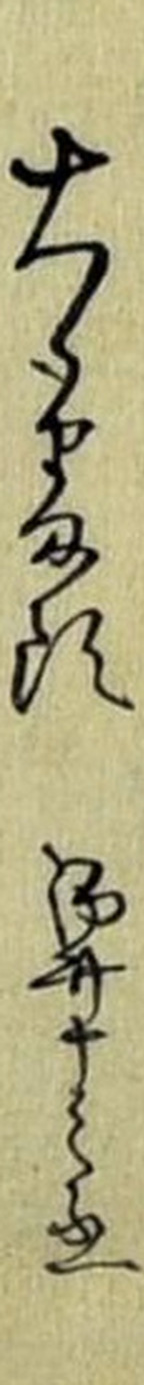大御番頭酒井十之丞
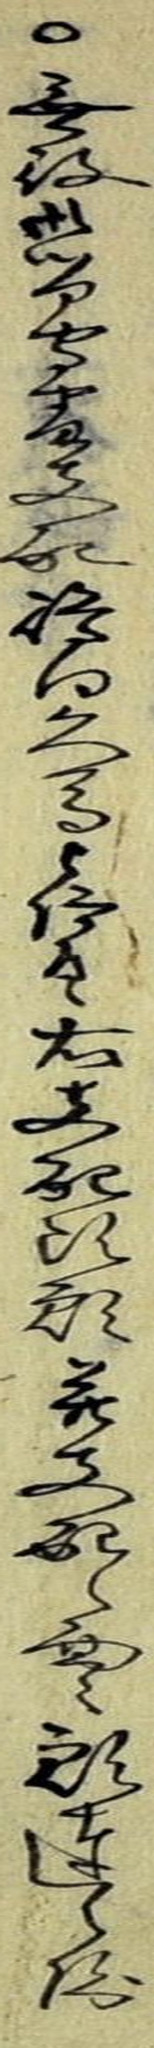○無役御留守番支配嶋田久馬被仰付候右支配頭願并支配之面々願達之儀
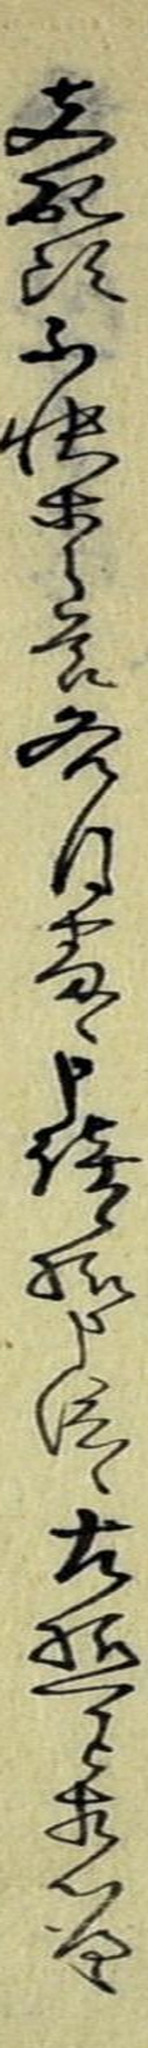支配頭不快等之節各月番へ申談候様申渡候左様可被相心得候
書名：命令之部 四
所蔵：福井県文書館 Fukui Prefectural Archives
